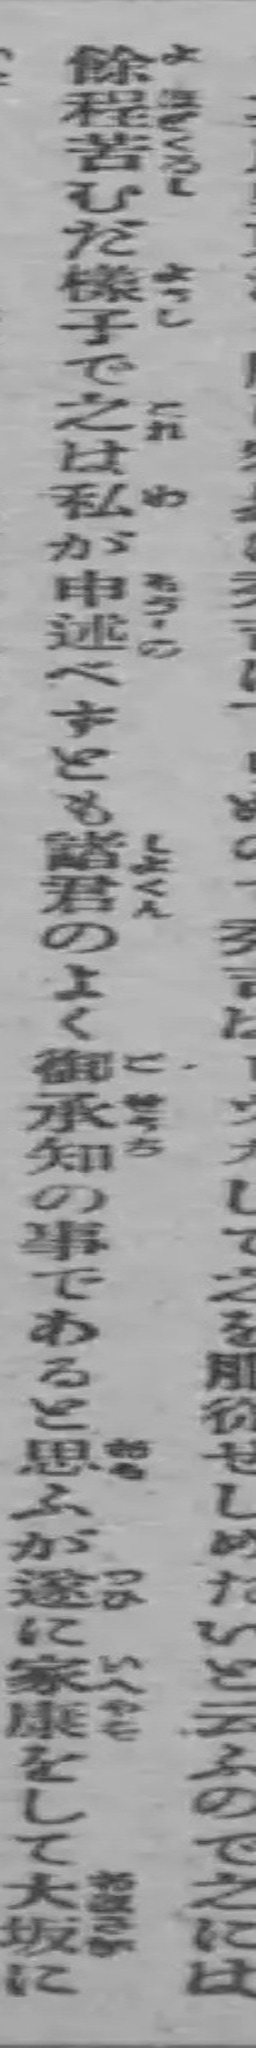余程苦むだ様子で之は私が申述べずとも諸君のよく御承知の事であると思ふが遂に家康をして大坂に
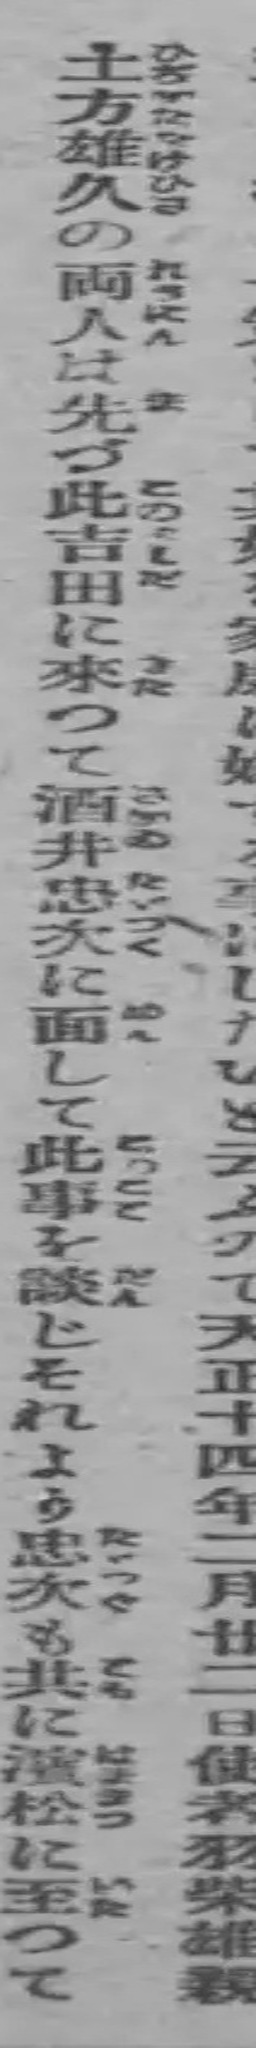土方雄久の両人は先づ此吉田に来つて酒井忠次に面して此事を談じそれより忠次も共に浜松に至つて
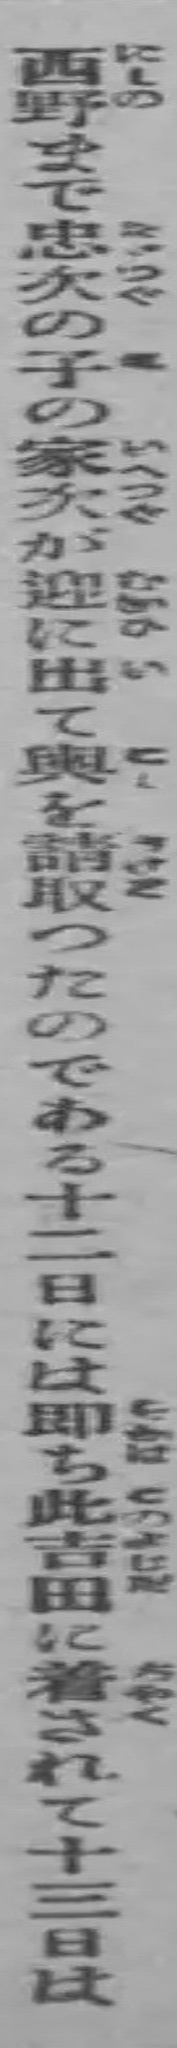西野まで忠次の子の家次が迎に出て輿を請取つたのである十二日には即ち此吉田に着されて十三日は
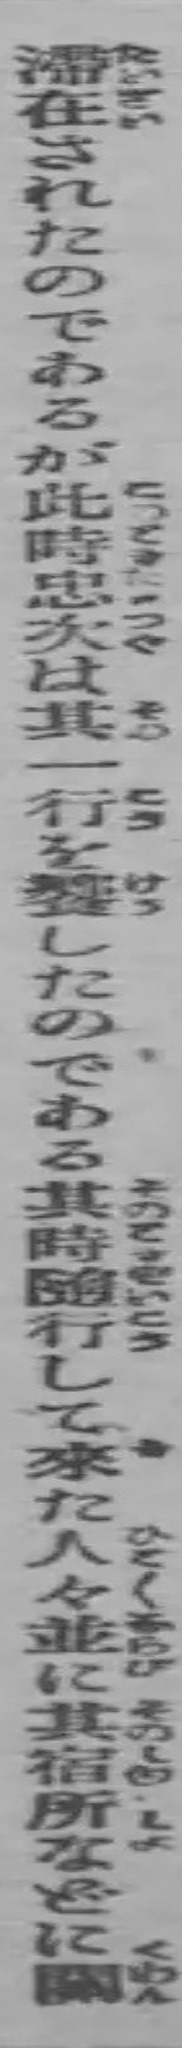滞在されたのであるが此時忠次は其一行を饗したのである其時随行して来た人々並に其宿所などに関
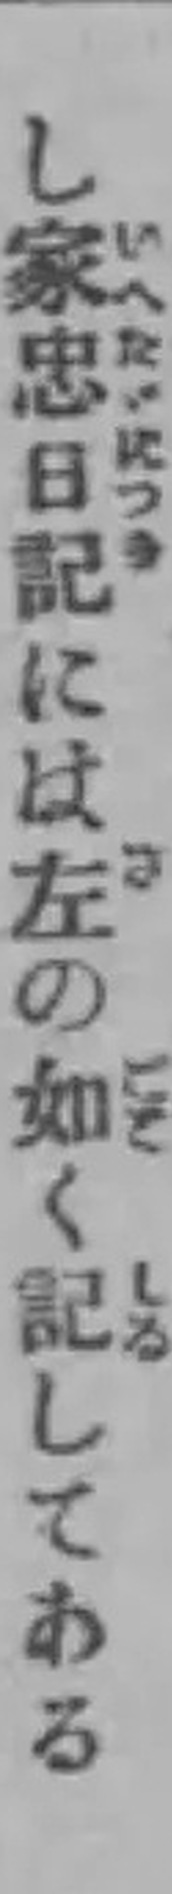し家忠日記には左の如く記してある
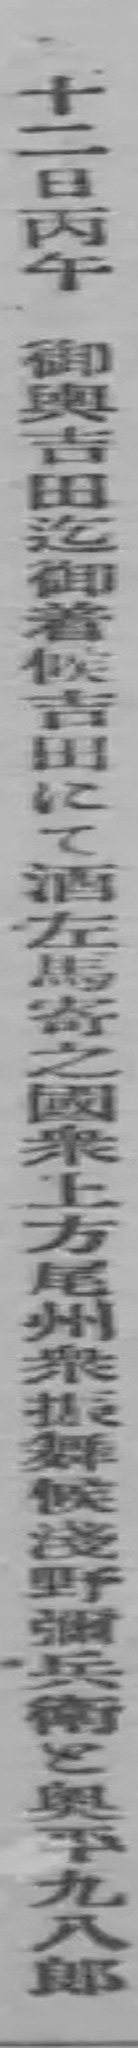十二日丙午御輿吉田迄御着候吉田にて酒左馬寄之国衆上方尾州衆振舞候浅野弥兵衛と奥平九八郎
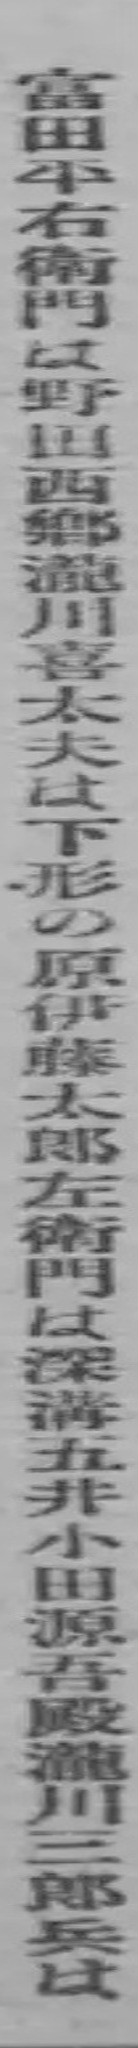富田平右衛門は野田西郷瀧川喜太夫は下形の原伊藤太郎左衛門は深溝五井小田源吾殿瀧川三郎兵は
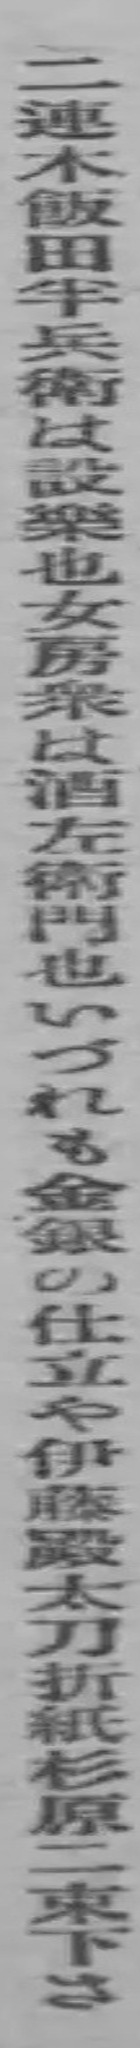二連木飯田半兵衛は設楽也女房衆は酒左衛門也いづれも金銀の仕立や伊藤殿太刀折紙杉原二束下さ
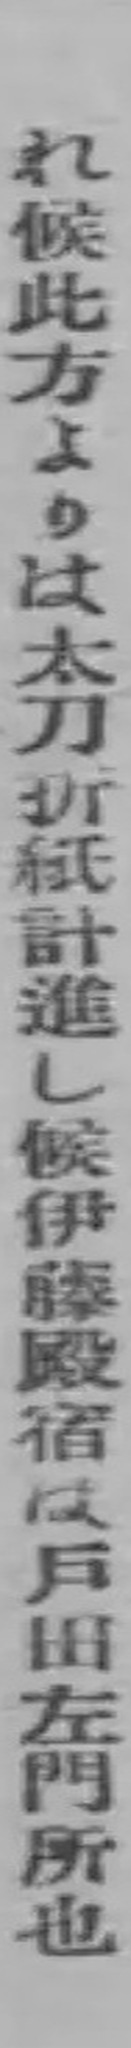れ候此方よりは太刀折紙計進し候伊藤殿宿は戸田左門所也
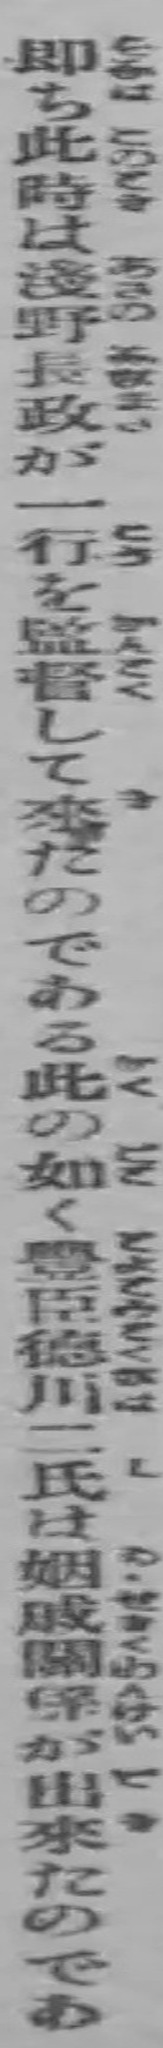即ち此時は浅野長政が一行を監督して来たのである此の如く豊臣徳川二氏は姻戚関係が出来たのであ
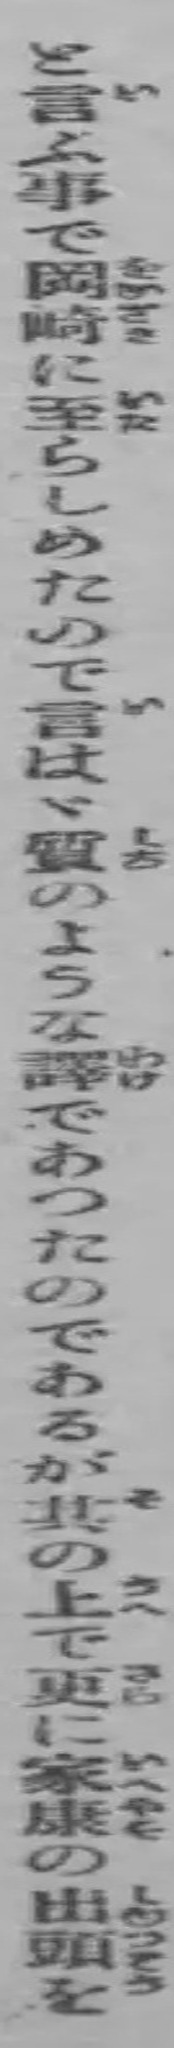と言ふ事で岡崎に至らしめたので言はゞ質のような訳であつたのであるが其の上で更に家康の出頭を
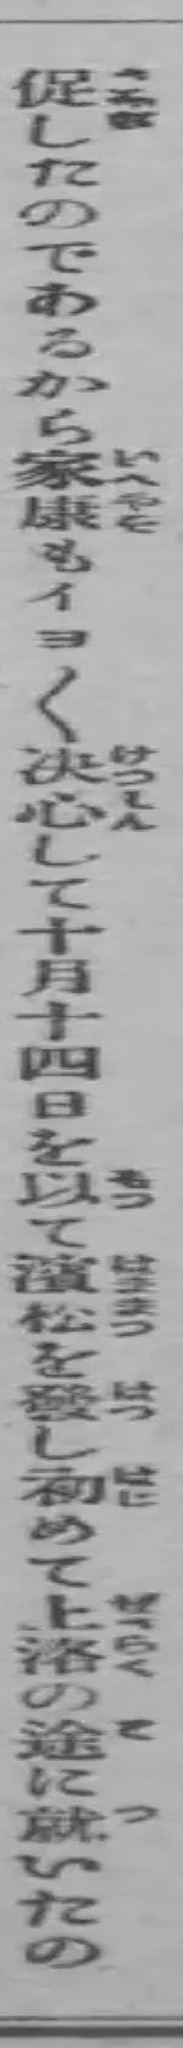家康の上洛促したのであるから家康もイヨ〳〵決心して十月十四日を以て浜松を発し初めて上洛の途に就いたの
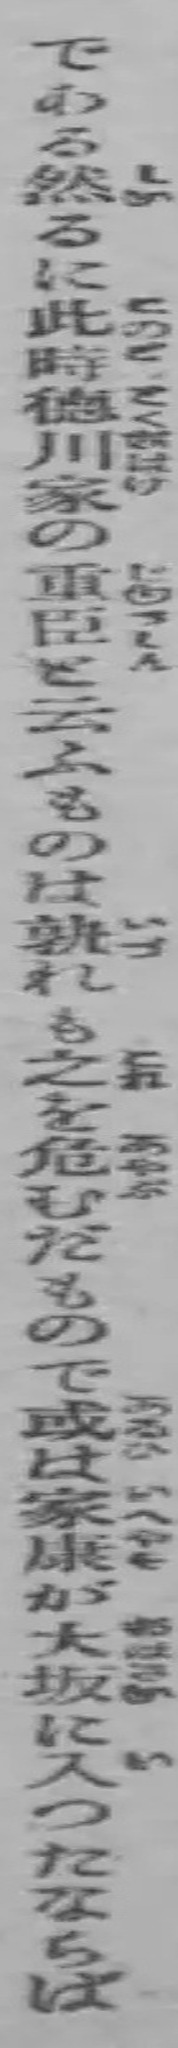である然るに此時徳川家の重臣と云ふものは孰れも之を危むだもので或は家康が大坂に入つたならば
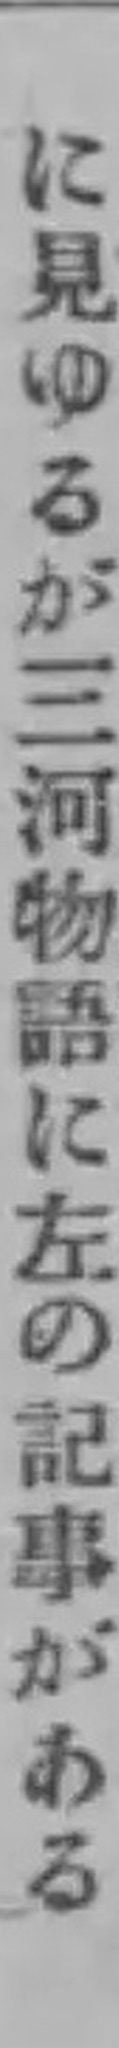に見ゆるが三河物語に左の記事がある
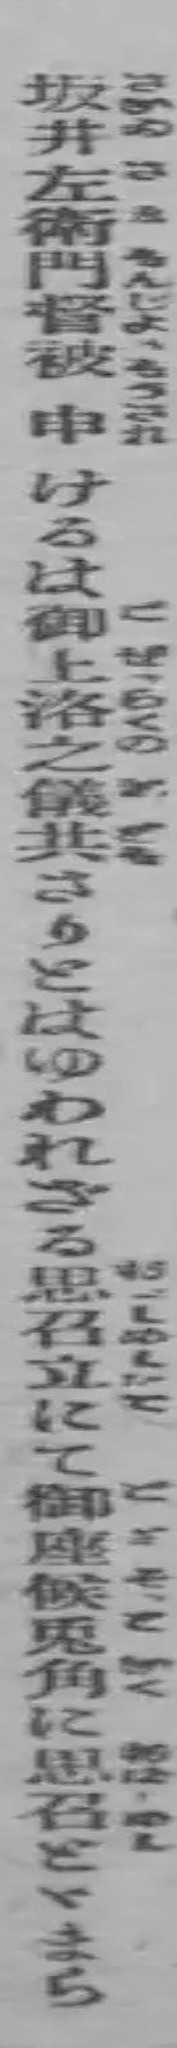坂井左衛門尉被申けるは御上洛之儀共さりとはゆわれざる思召立にて御座候兎角に思召とゞまら
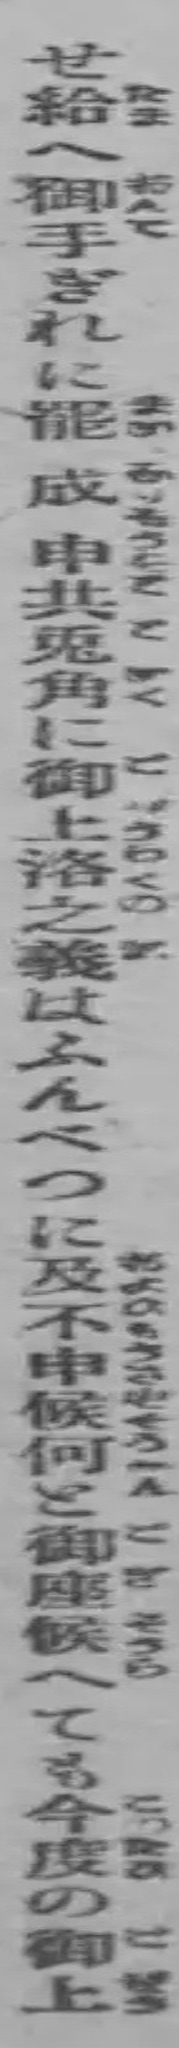せ給へ御手ぎれに罷成申共兎角に御上洛之儀はふんべつに及不申候何と御座候へても今度の御上
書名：豊橋市史談
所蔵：国立国会図書館 National Diet Library, JAPAN
